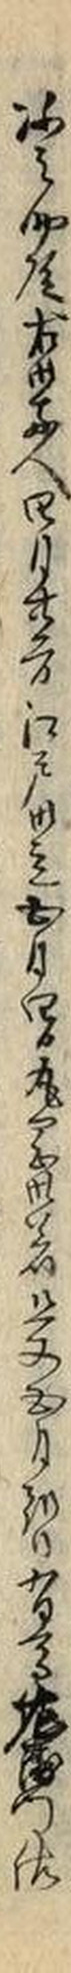弥之助殿右御両人四月廿二日江戸御立五月四日丸岡御着且又五月朔日有馬左衛門佐
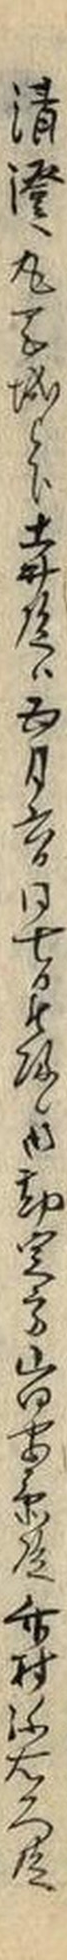清澄へ丸岡城被下土井殿ハ五月六日同七日罷帰候由勘定方山田半兵衛殿竹村弥右衛門殿
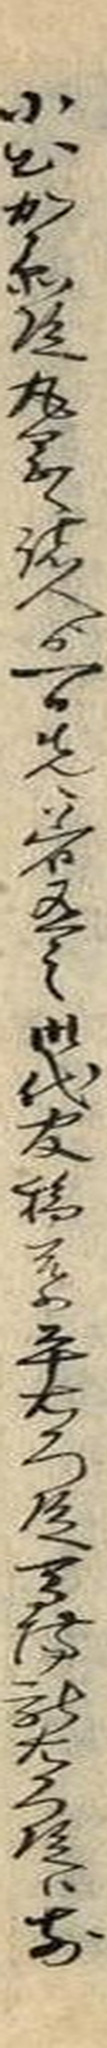小出加兵衛殿丸岡へ諸人ゟ一日先へ着有之御代官稲葉平右衛門殿馬場新左衛門殿ハ前
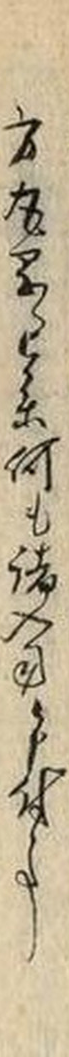方丸岡へ被参何も諸入用被申付候事
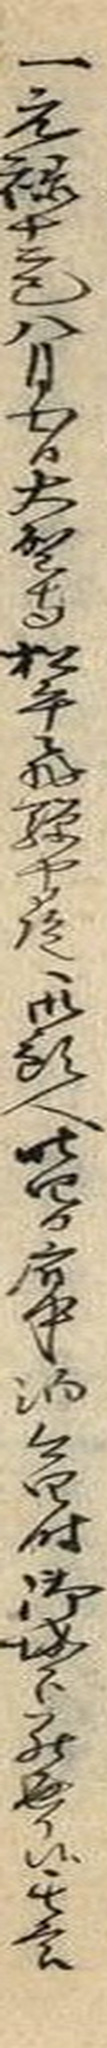一元禄十二巳八月五日大聖寺松平飛騨守殿へ御預人昨四日府中泊今四時御城下罷通り候其節
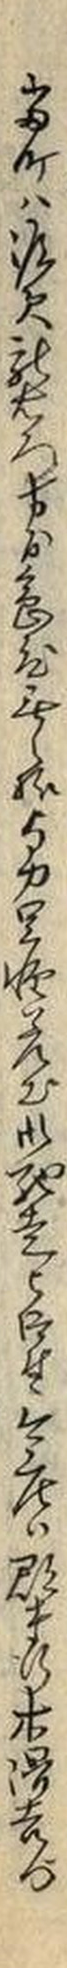当町ハ渥美新右衛門方ゟ急度無之様与力足軽差出御馳走被仰付候今庄ハ郡奉行木滑吉右衛門
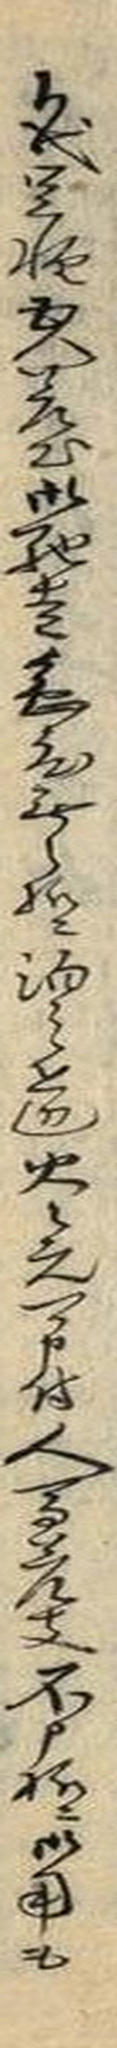下代足軽五人差出御馳走急度無之様ニ泊之近辺火之元可申付人馬差支不申様ニ御用も
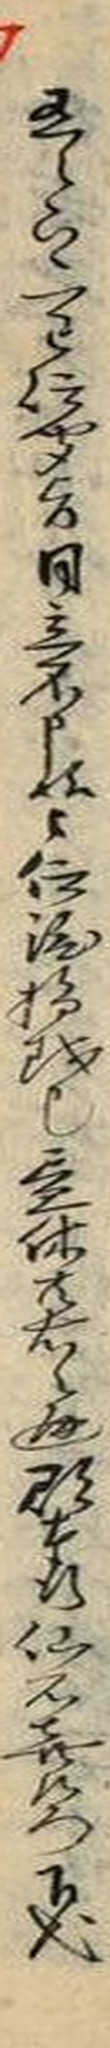有之候ハヽ可被仰聞旨目立不申様被仰渡指越申候昼休共右之通郡奉行仙石喜左衛門下代

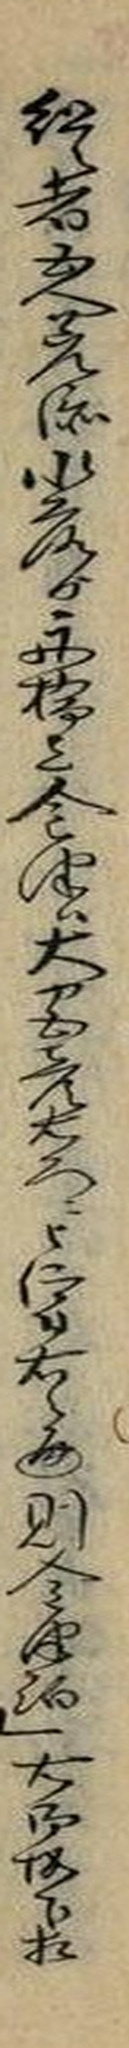組之者五人差添水落ゟ舟橋迄金津ハ大宮彦右衛門ニ被仰付右之通則金津泊」右御城下相
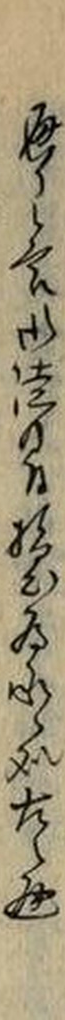通り候節御徒目付指出為承候処左之通
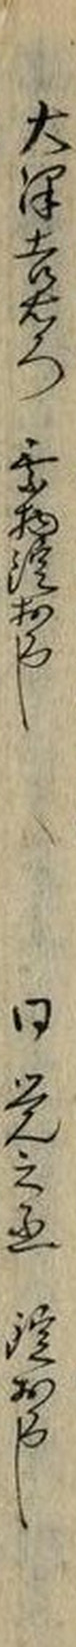大津吉右衛門乗物錠おろし同覚之丞錠おろし
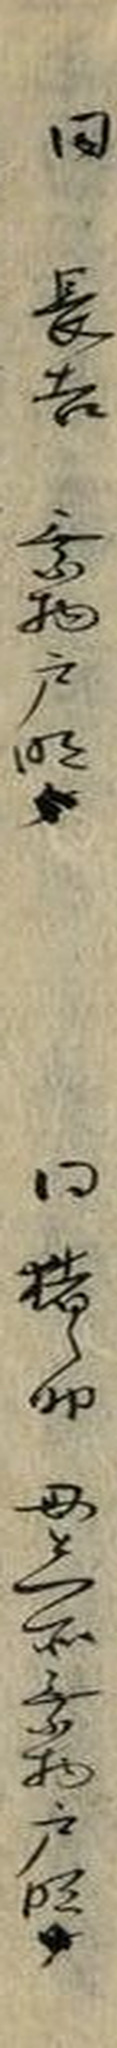同長吉乗物戸明同猪之助母と一所乗物戸明
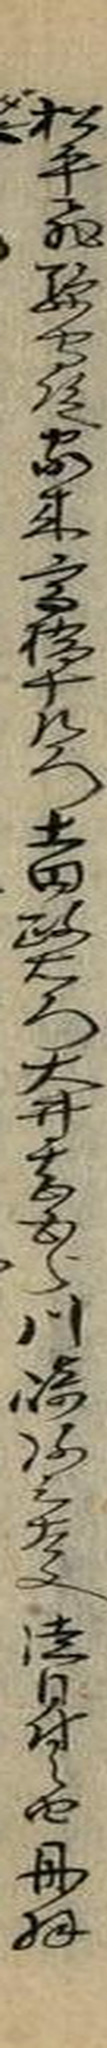松平飛騨守殿家来高橋十左衛門土田政右衛門大井甚五郎川崎弥三太夫徒目付之由丹羽
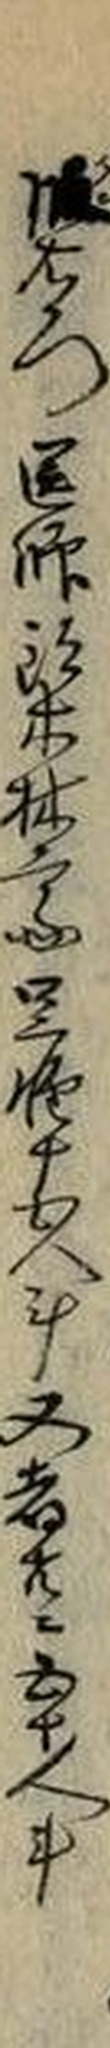段右衛門医師鈴木林斎足軽十五人斗又者共ニ五十人斗
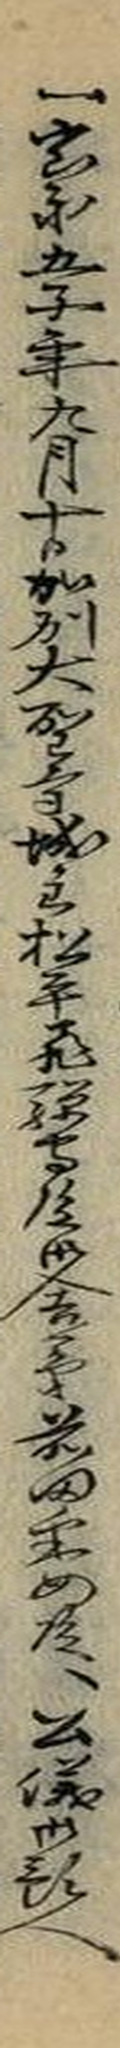一宝永五子年九月十日加州大聖寺城主松平飛騨守殿御舎弟前田采女殿へ公儀御預人
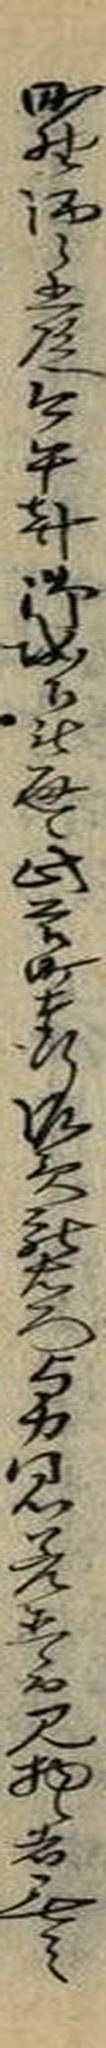町野酒之丞殿今午刻御城下被通候此節町奉行渥美新右衛門与力同心差置候而見物之者無之
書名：御国他国諸事之部
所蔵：福井県文書館 Fukui Prefectural Archives
